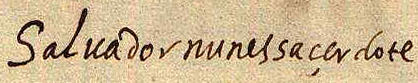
Saluador nunes saçerdote
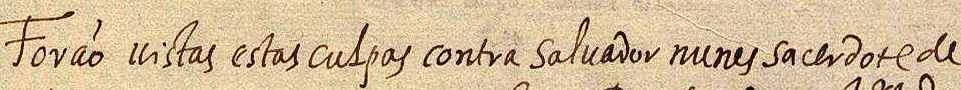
Forão uistas estas culpas contra saluador nunes sacerdote de
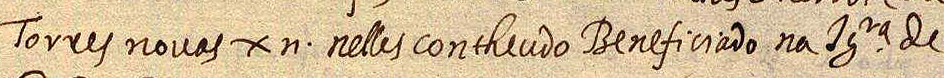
Torres nouas x n. nelles contheudo Beneficiado na Igra. de
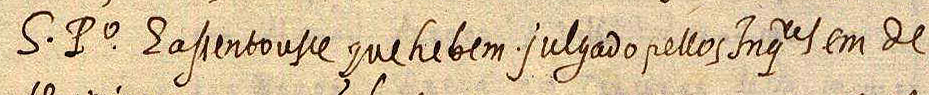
S. Po. E assentousse que he bem julgado pellos Inqres em de
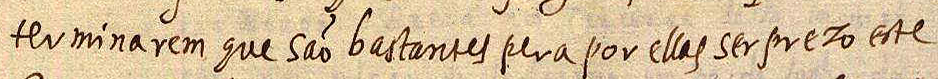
terminarem que são bastantes pera por ellas ser prezo este
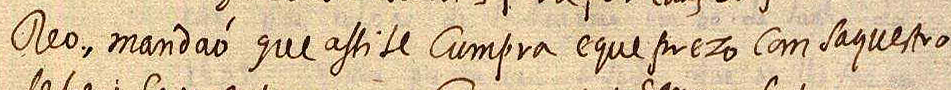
Reo, mandaõ que assi se Cumpra e que prezo com saquestro
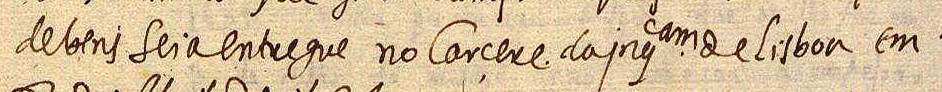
de bens seia entregue no Carçere da jnqcam. de Lisboa em
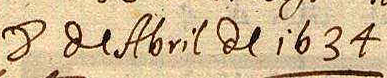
8 de Abril de i634
